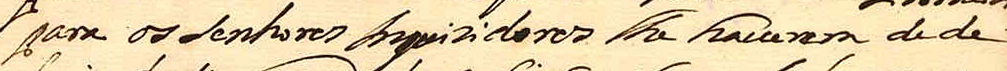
para os senhores Inquizidores lhe hauerem de de
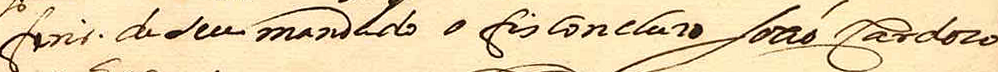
ferir. de seu mandado o fis concluzo Joaõ Cardozo
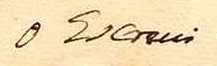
o Escreui.
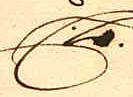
Clo.
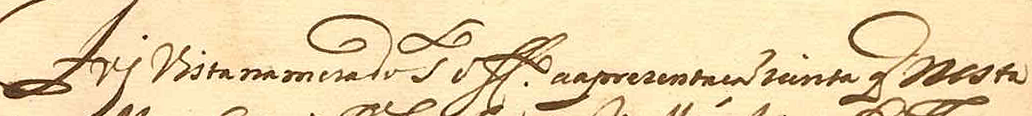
Foj Vista na meza do Sto off.o a aprezentaçaõ iunta q̄ nesta
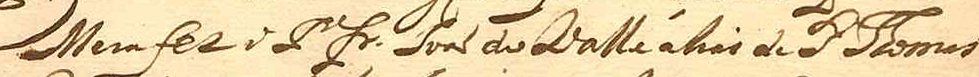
Meza fez o Pe fr. Ioaõ do Valle alias de Sto Thomas
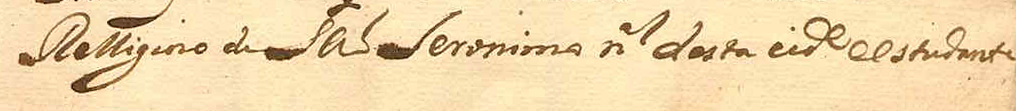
Relligiozo de Saõ Ieronimo nal desta cide e estudante
